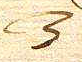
3
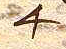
4
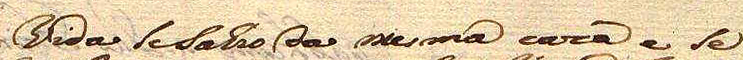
Vida se sahio da mesma caza e se
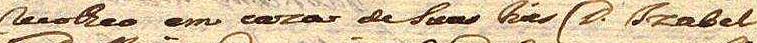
Recolheo em caza de suas tias D. Izabel
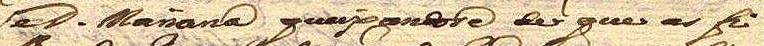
e D. Mariana queixandose de que as fi
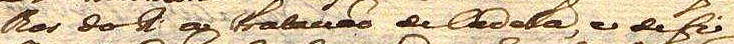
lhas do R. a tratauaõ de Cadella, e de fi
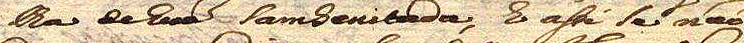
lha de hua sambenitada, E assi se não
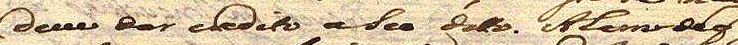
deue dar credito a seo ditto. Alem de q̄
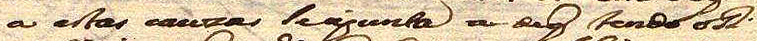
a estas cauzas se ajunta a de q̄ tendo o R.
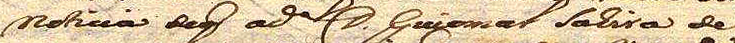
noticia de q̄ a da D. Guiomar sahira de
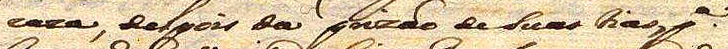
caza, despois da prizão de suas tias, pa.
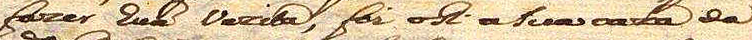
fazer huā vezita, foi o R. a sua caza da
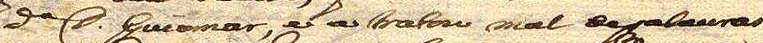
da D. Guiomar, e a tratou mal de palauras
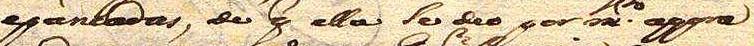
e pancadas, de q̄ ella se deo por m.to aggra
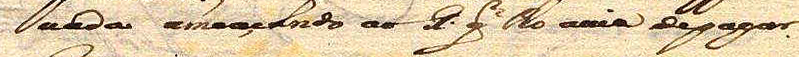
uada ameaçando ao R. q̄ lho auia de pagar.
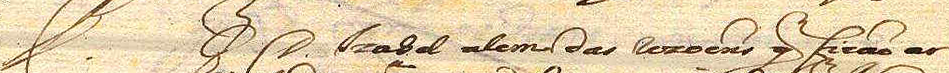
P. Q̄ D. Izabel alem das rezoen̄s q̄ ficão ar
